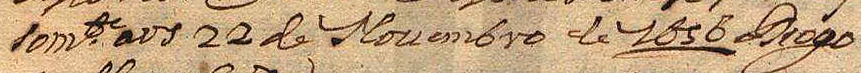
som.te aos 22 de Nouembro de 1656 Diogo
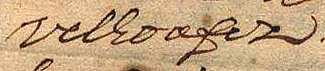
Velho a fez
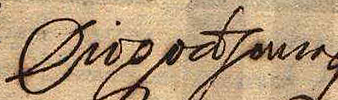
Diogo d̄ souza
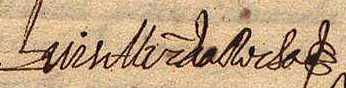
Luis Alvz̄ da Rocha
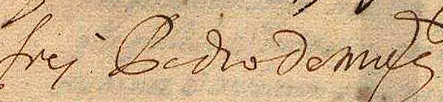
frej Pedro Domingos
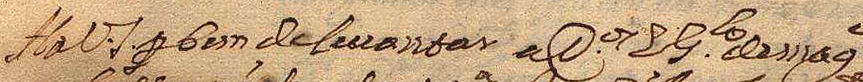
Ha V. S. ꝓ bem de leuantar a D.os E G.lo de mages
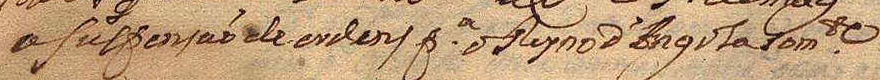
a suspensaõ de ordens p.a o Reyno d'Angola som.te
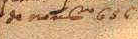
de nouro 656
